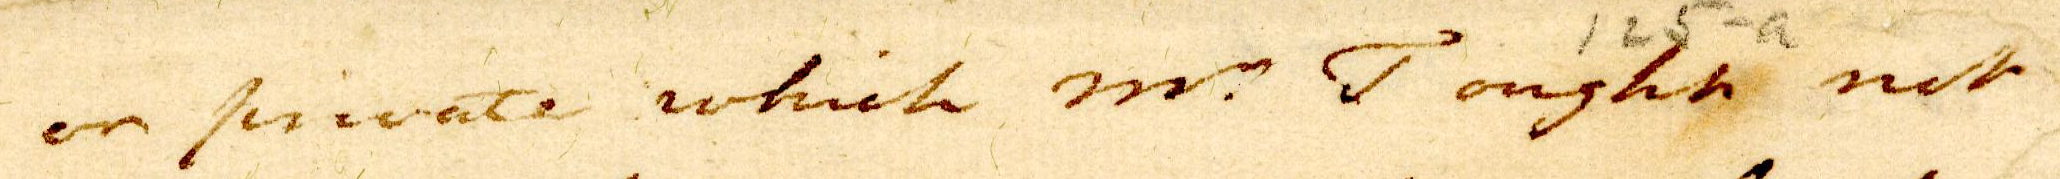or private which m^r Tongh not
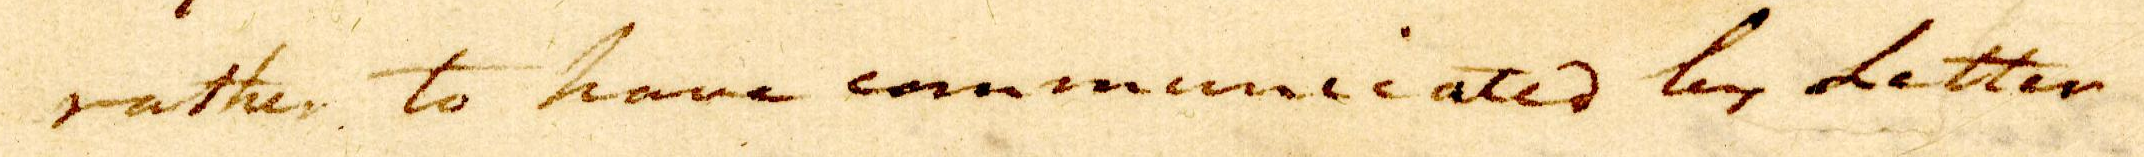rather to have communicated by Letter
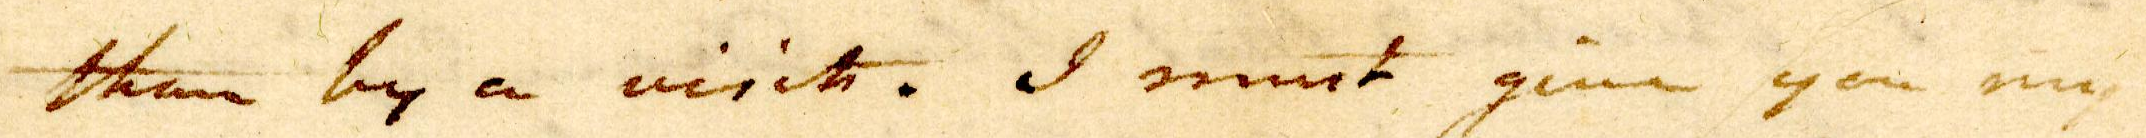than by a visit. I must give you my
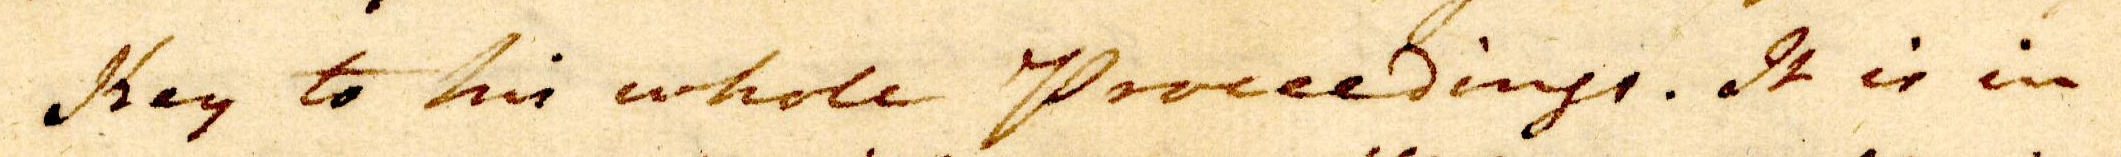Key to his whole proceedings. It is in
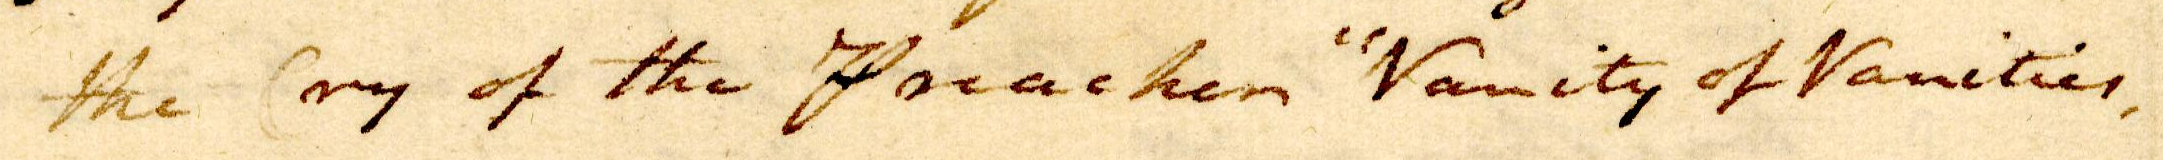the Cry of the Preacher "Vanity of Vanities
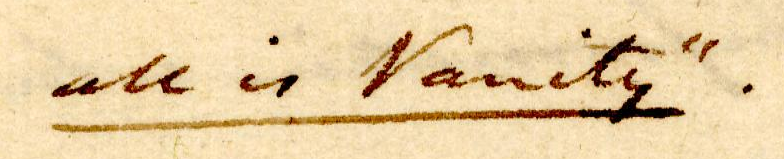all is Vanity"
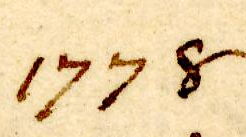1778
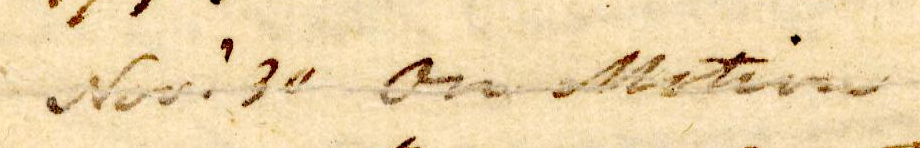Nov^r. 30 on Martins
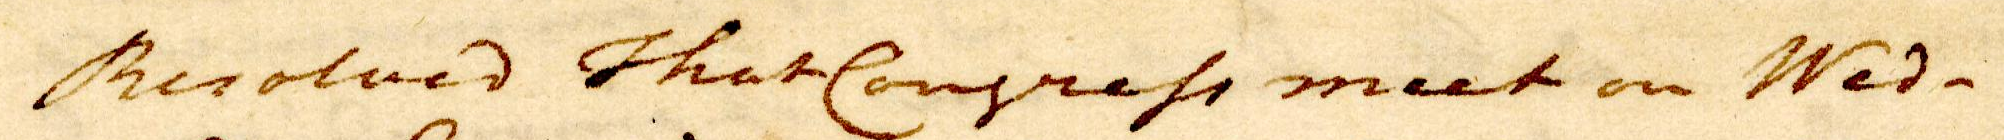Resolved that Congress must on Wed-
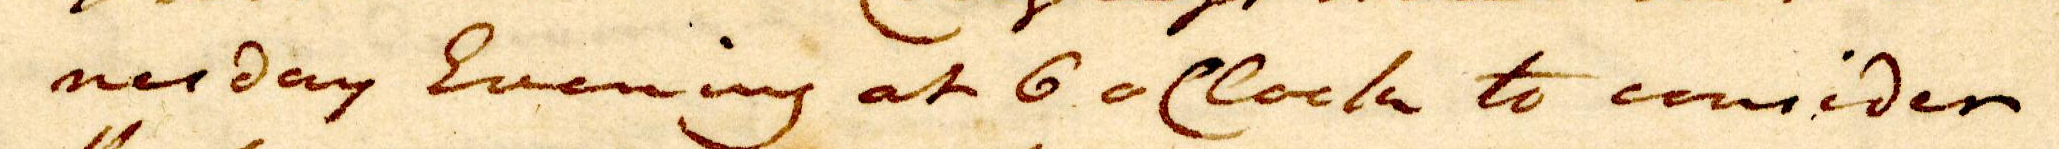nesday Evening at 6 oClock to consider
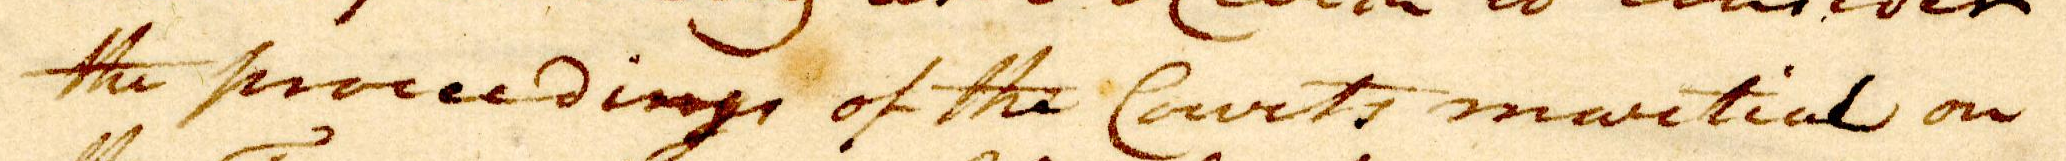the proceedings of the Courts martial on
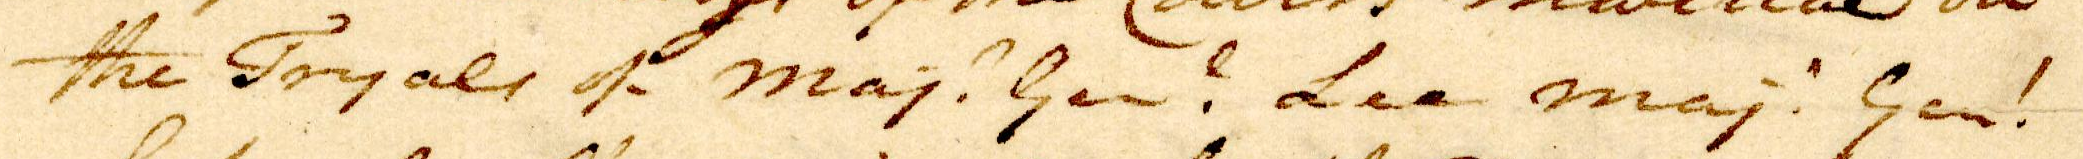the Tryals of Maj^r. Gen^l. Lee maj^r. Gen^l.
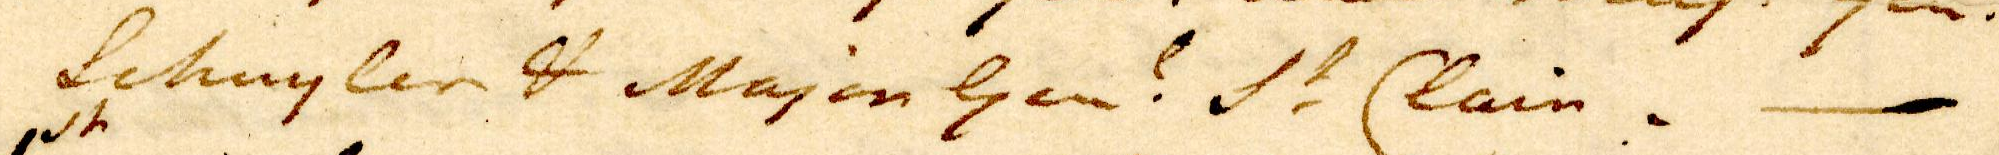Schuyler & Major Gen^l. S^t. Clair.-
